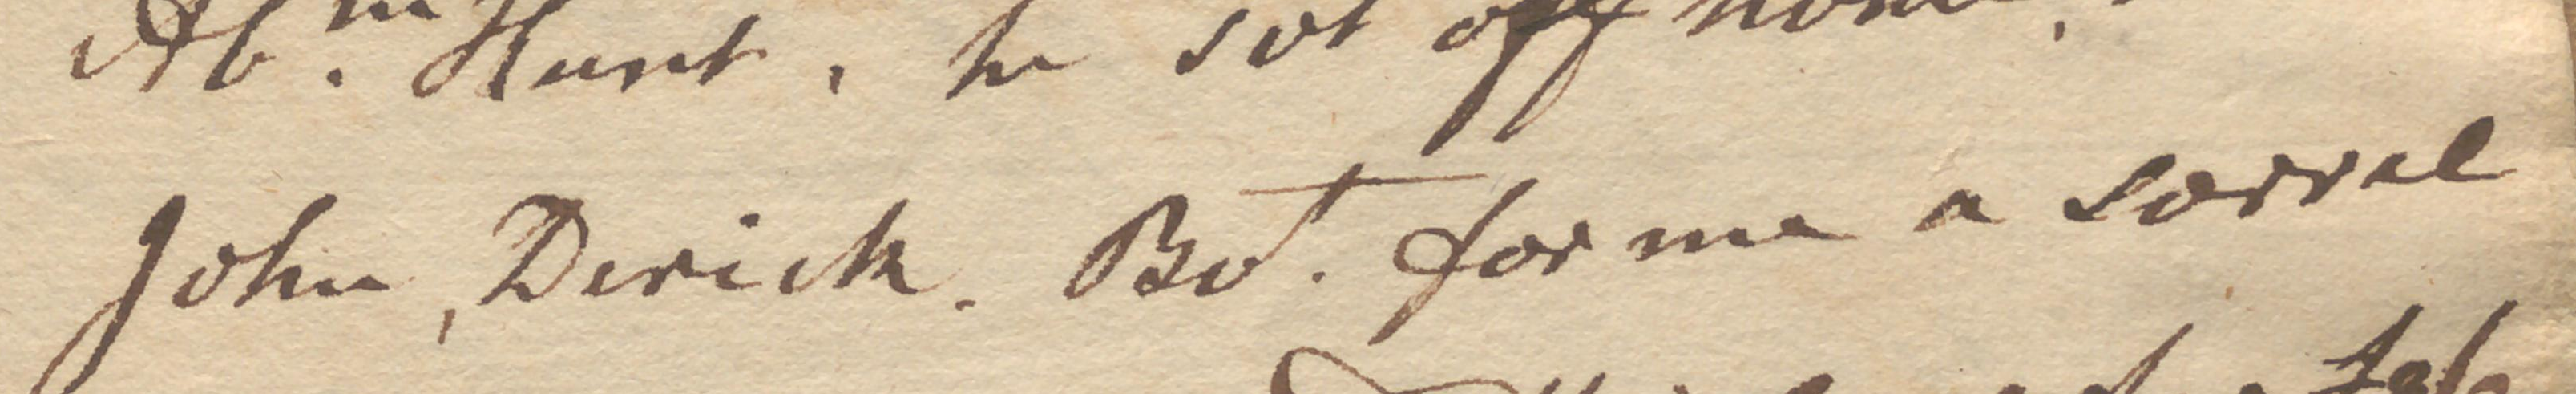John Derick Bo^t. for me a sorrel
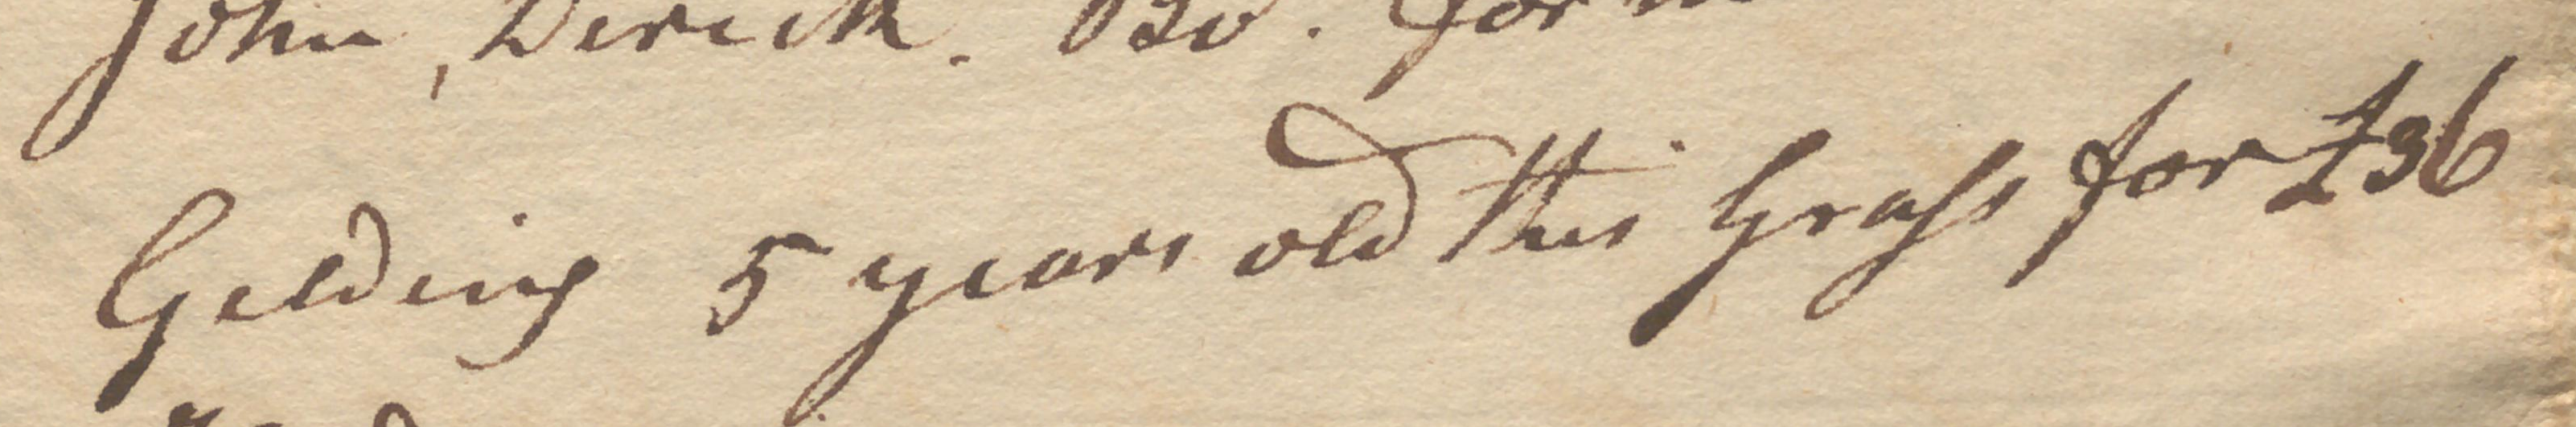Gelding 5 years old this Grass for £36
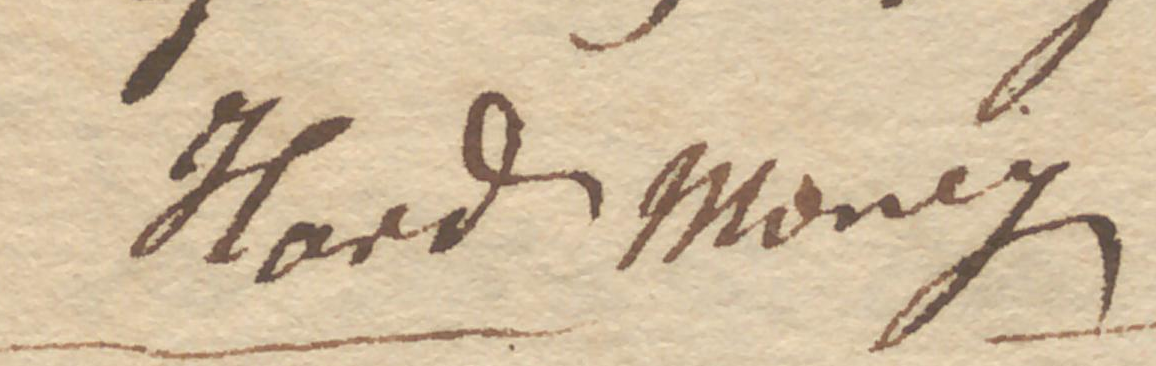Hard Money
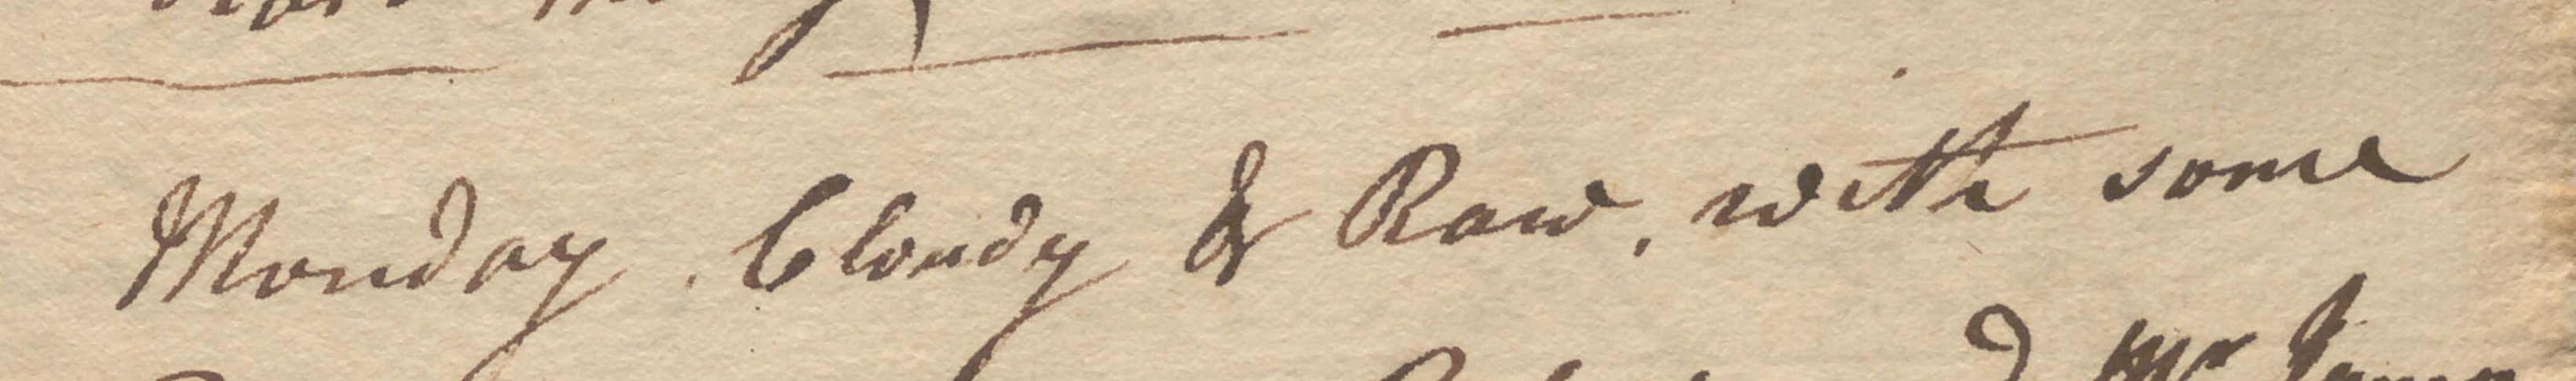Monday. Cloudy, & Raw, with some
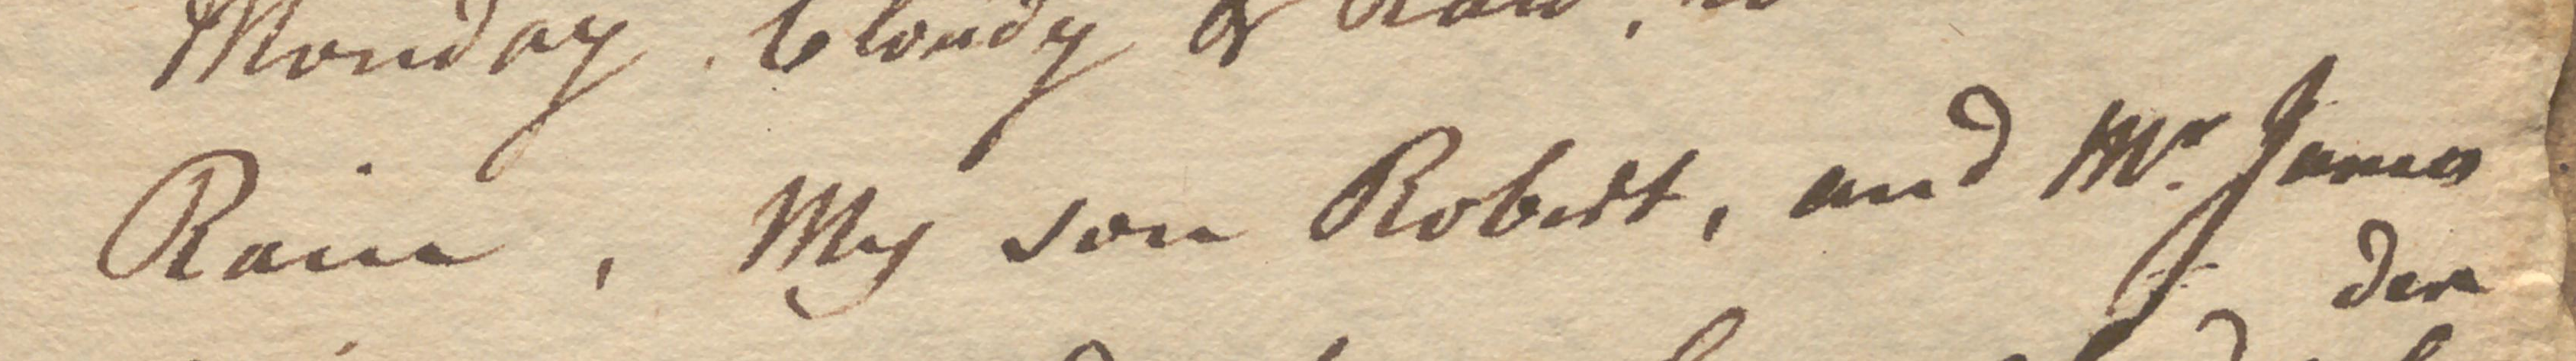Rain, My son Robert, and M^r. James
